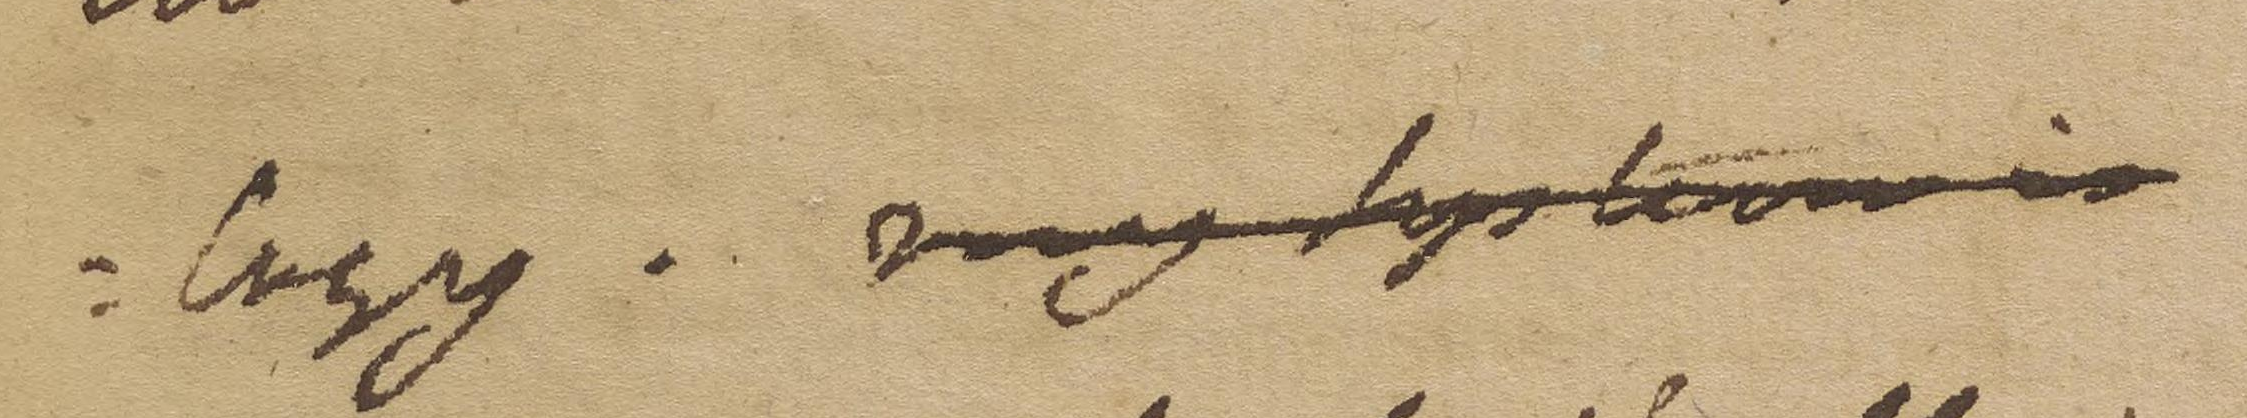-logy. [my system is]
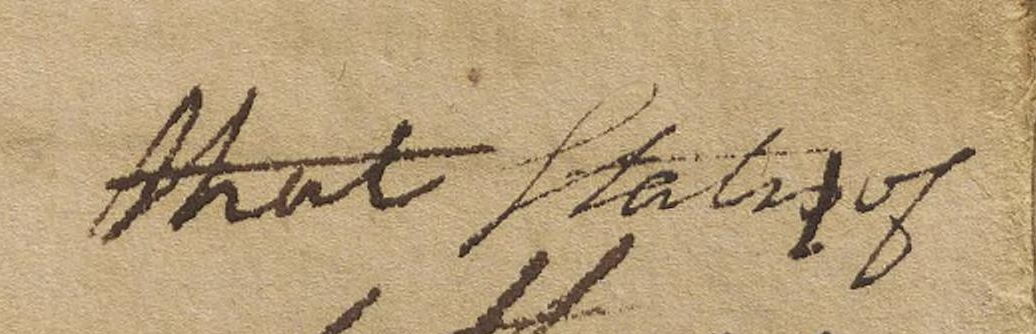that status of
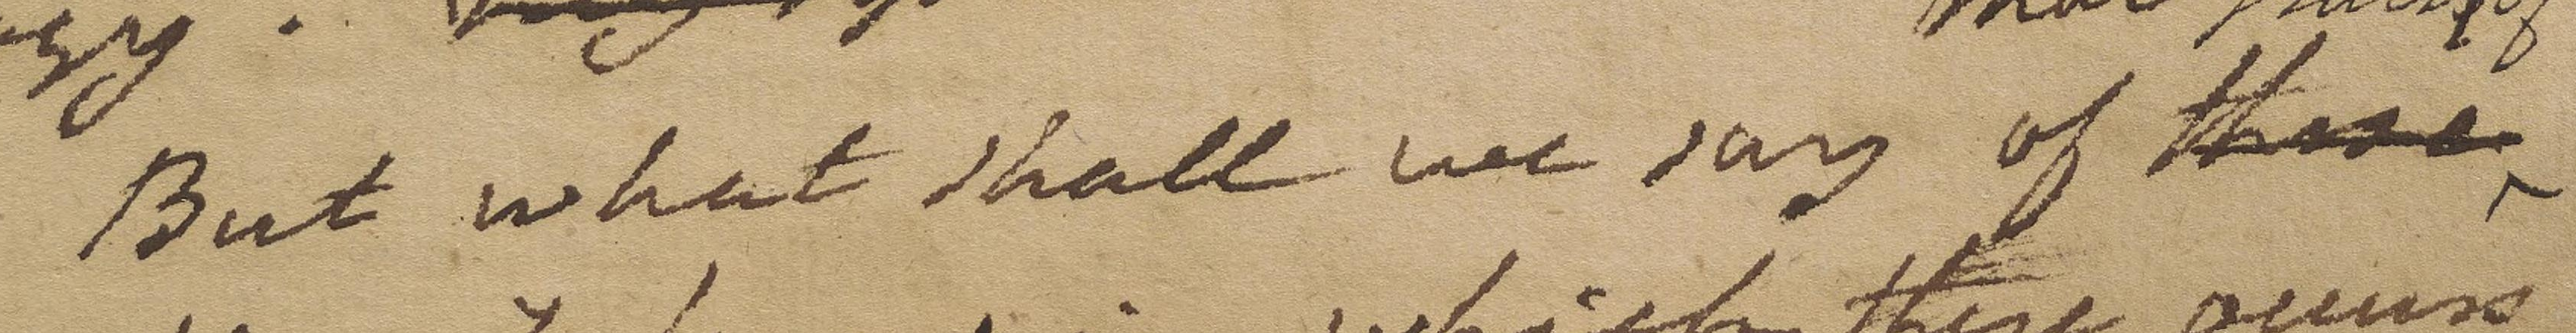But what shall we say of [these] ^
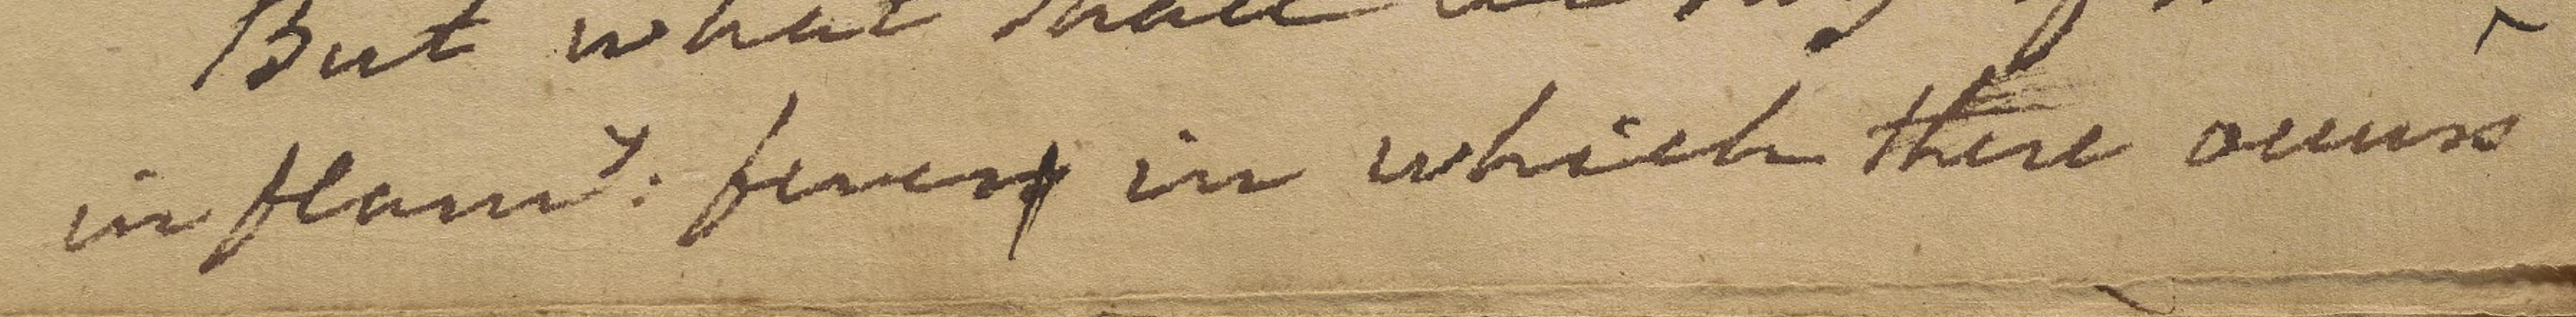in inflam^y fever in which there occurs
